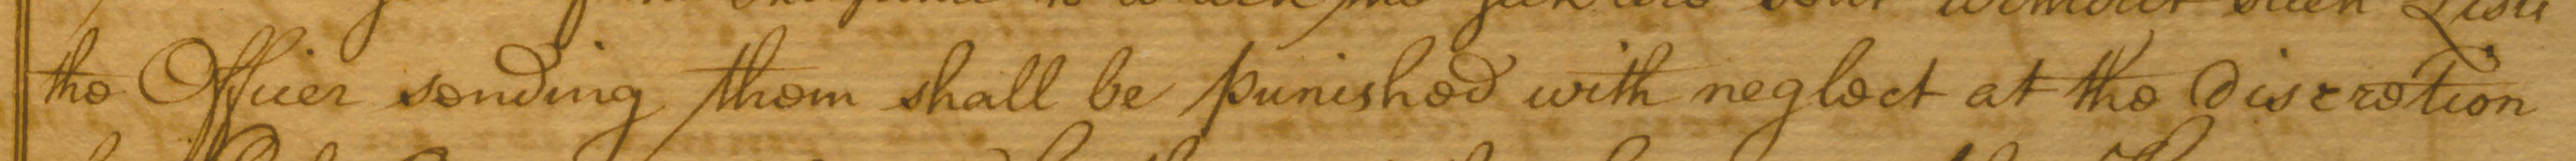the Officer sending them shall be punished with neglect at the discretion
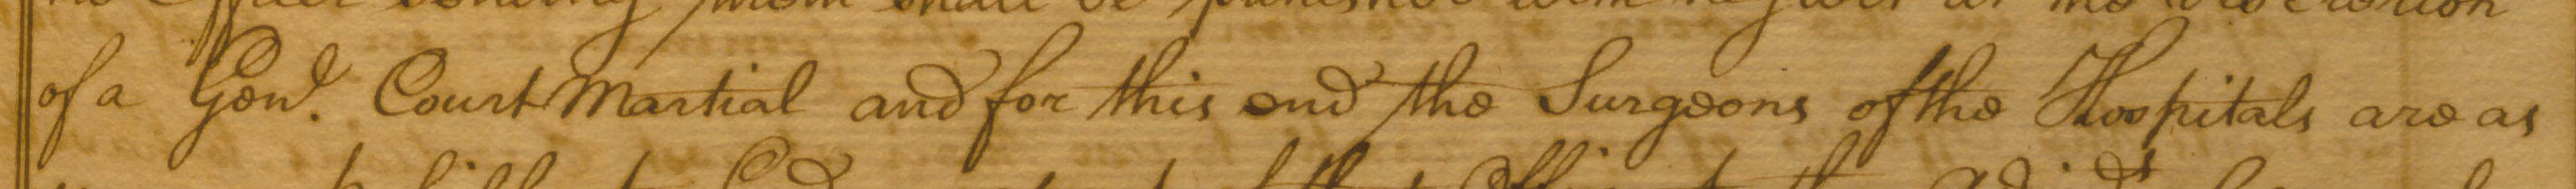of a Gen^l. Court Martial and for this and the Surgeons of the Hospital are as
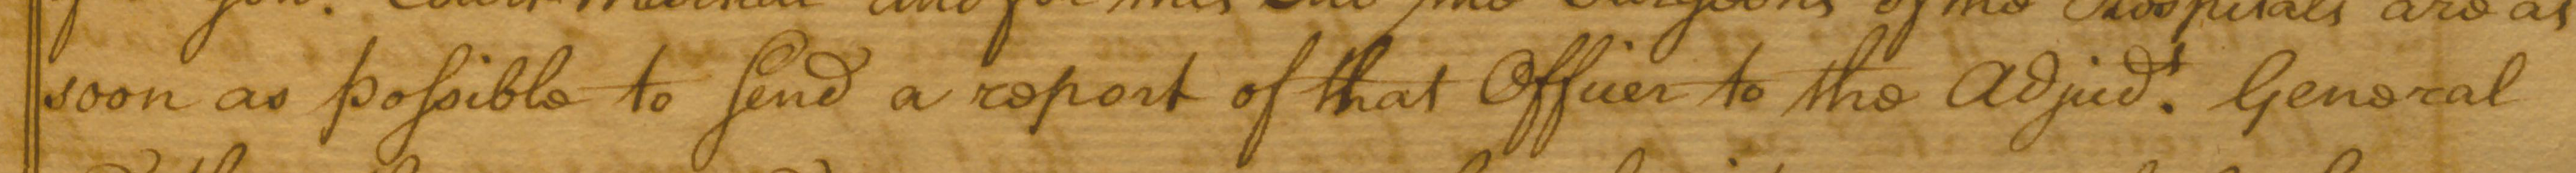soon as possible to send a report of that Officer to the Adjud^t. General
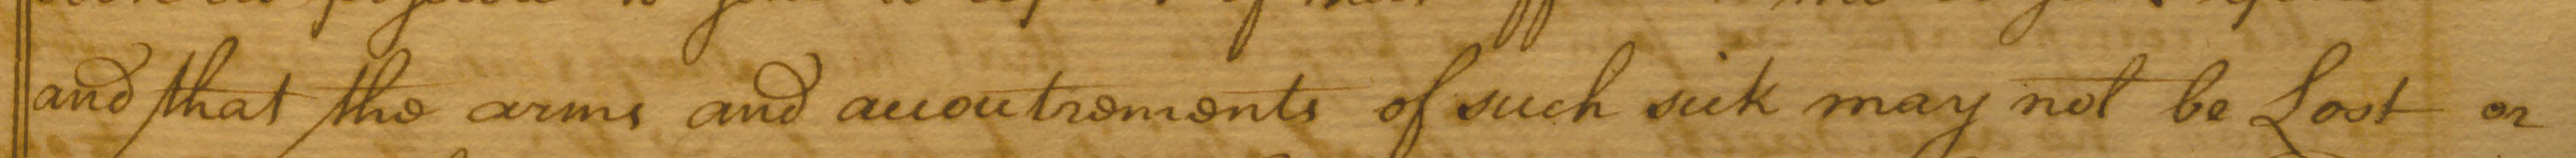and that the arms and accoutrements of such sick may not be Lost or
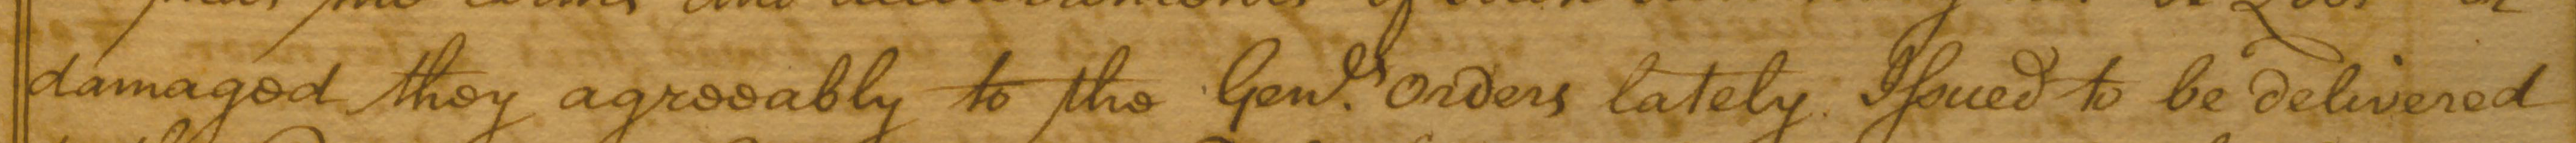damaged they agreeably to the Gen^l. Orders lately Issued to be delivered
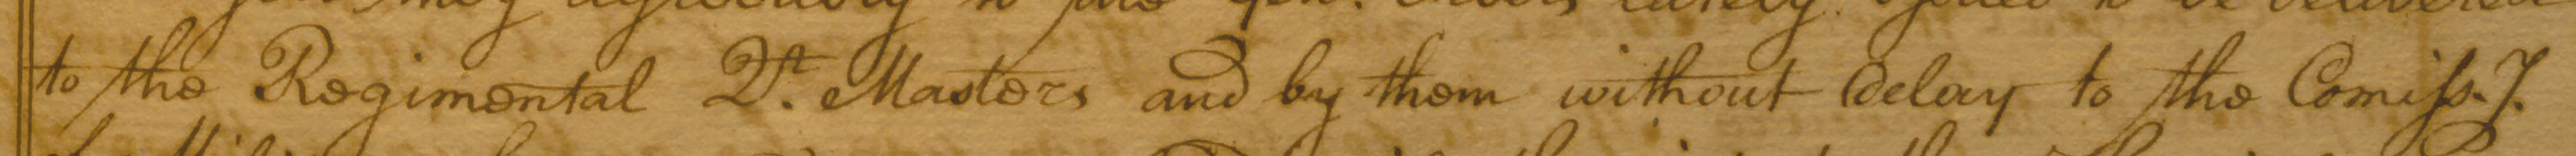to the Regimental Q^r. Masters and by them without delay to the Comiss^y.
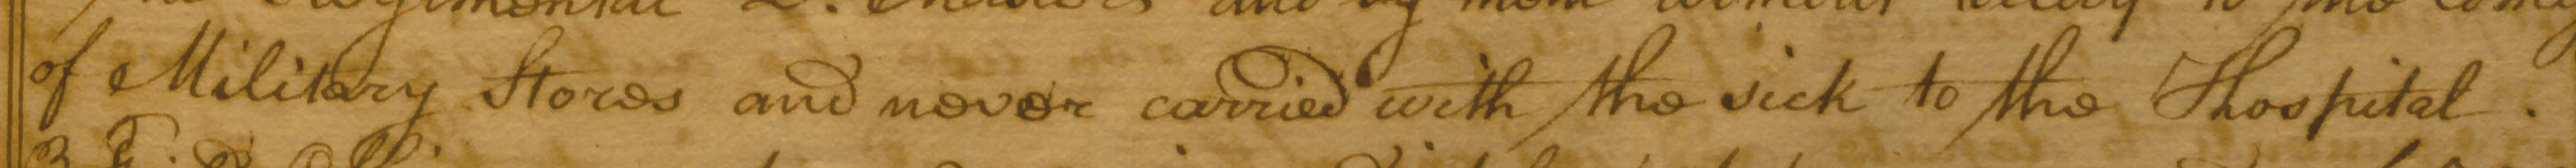of Military Stores and never carried with the sick to the Hospital.
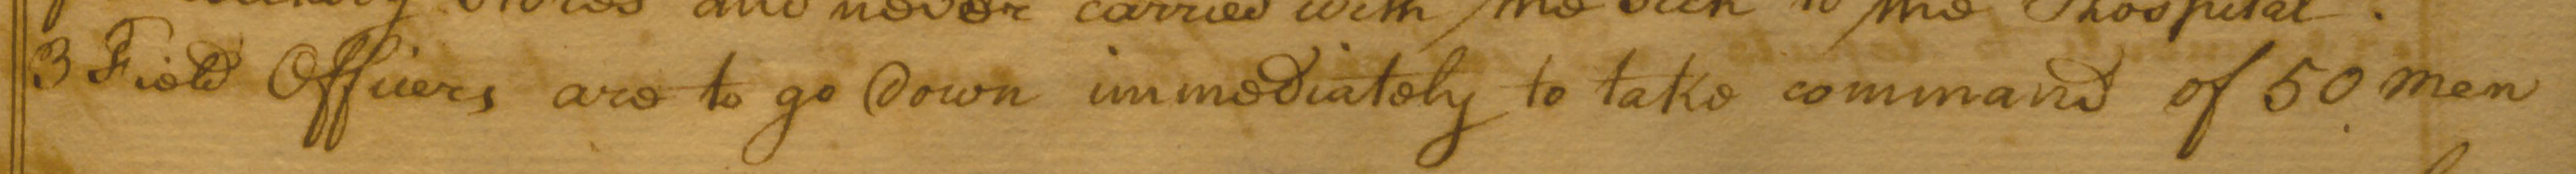3 Field officers are to go down immediately to take command of 50 men
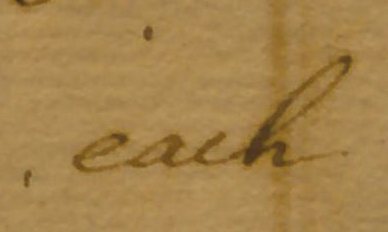each
